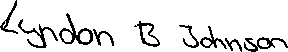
Lyndon B. Johnson
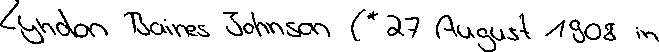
Lyndon Baines Johnson (* 27. August 1908 in
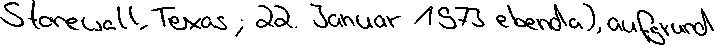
Stonewall, Texas; 22. Januar 1973 ebenda), aufgrund
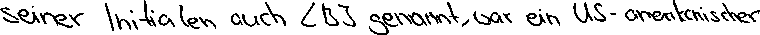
seiner Initialen auch LBJ genannt, war ein US-amerikanischer
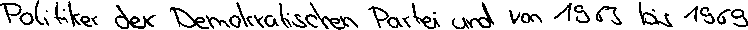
Politiker der Demokratischen Partei und von 1963 bis 1969
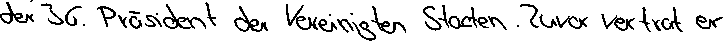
der 36. Präsident der Vereinigten Staaten. Zuvor vertrat er
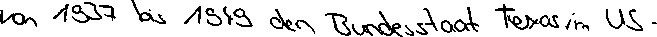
von 1937 bis 1949 den Bundesstaat Texas im US-
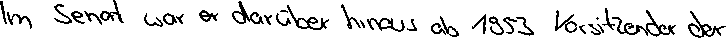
Im Senat war er darüber hinaus ab 1953 Vorsitzender der
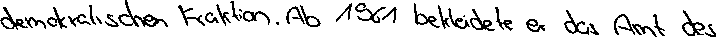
demokratischen Fraktion. Ab 1961 bekleidete er das Amt des
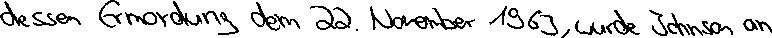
dessen Ermordung, dem 22. November 1963, wurde Johnson an
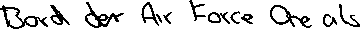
Bord der Air Force One als
